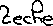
Zeche
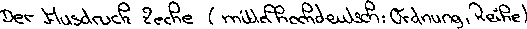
Der Ausdruck Zeche (mittelhochdeutsch: Ordnung, Reihe)
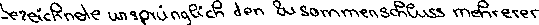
bezeichnete ursprünglich den Zusammenschluss mehrerer
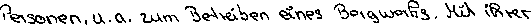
Personen, u. a. zum Betreiben eines Bergwerks. Mit ihrer
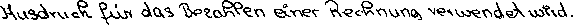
Ausdruck für das Bezahlen einer Rechnung verwendet wird.
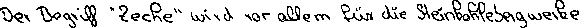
Der Begriff "Zeche" wird vor allem für die Steinkohlebergwerke
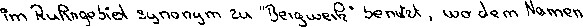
im Ruhrgebiet synonym zu "Bergwerk" benutzt, wo dem Namen
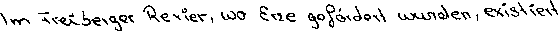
Im Freiberger Revier, wo Erze gefördert wurden, existiert
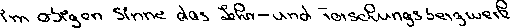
im obigen Sinne das Lehr- und Forschungsbergwerk
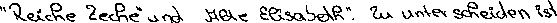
"Reiche Zeche" und "Alte Elisabeth".Zu unterscheiden ist
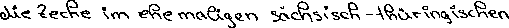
die Zeche im ehemaligen sächsisch-thüringischen
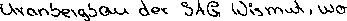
Uranbergbau der SAG Wismut, wo
